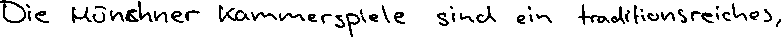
Die Münchner Kammerspiele sind ein traditionsreiches,
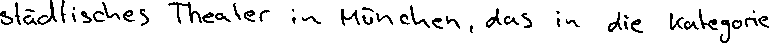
städtisches Theater in München, das in die Kategorie
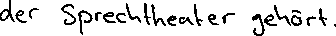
der Sprechtheater gehört.
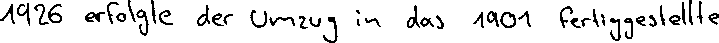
1926 erfolgte der Umzug in das 1901 fertiggestellte
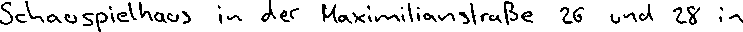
chauspielhaus in der Maximilianstraße 26 und 28 in
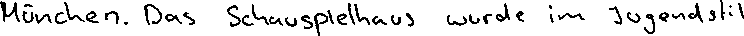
München. Das Schauspielhaus wurde im Jugendstil
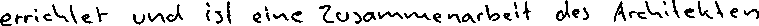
errichtet und ist eine Zusammenarbeit des Architekten
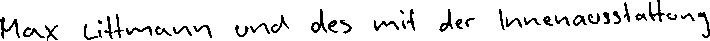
Max Littmann und des mit der Innenausstattung
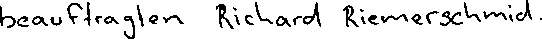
beauftragten Richard Riemerschmid.
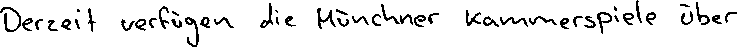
Derzeit verfügen die Münchner Kammerspiele über
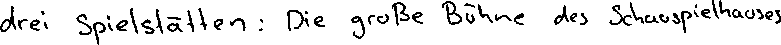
drei Spielstätten: Die große Bühne des Schauspielhauses
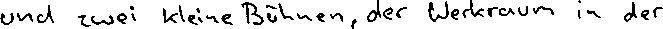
und zwei kleine Bühnen, der Werkraum in der
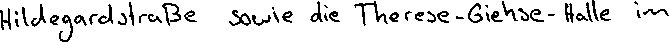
Hildegardstraße sowie die Therese-Giehse-Halle im
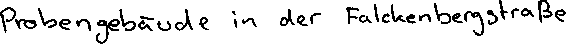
Probengebäude in der Falckenbergstraße
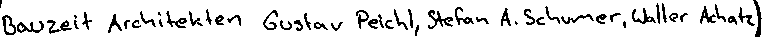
Bauzeit Architekten Gustav Peichl, Stefan A. Schumer, Walter Achatz)
